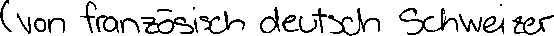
(von französisch deutsch Schweizer
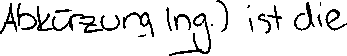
Abkürzung Ing.) ist die
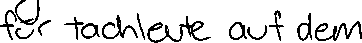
für Fachleute auf dem
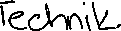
Technik.
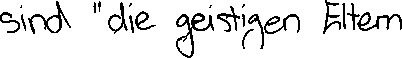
sind "die geistigen Eltern
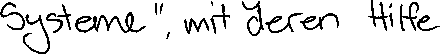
Systeme", mit deren Hilfe
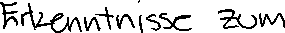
Erkenntnisse zum
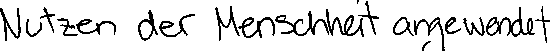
Nutzen der Menschheit angewendet
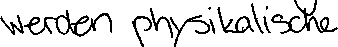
werden physikalische
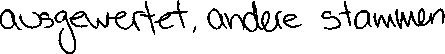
ausgewertet, andere stammen
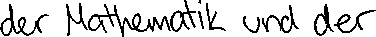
der Mathematik und der
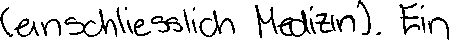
(einschließlich Medizin). Ein
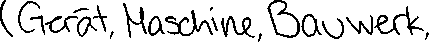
(Gerät, Maschine, Bauwerk,
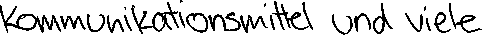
Kommunikationsmittel und viele
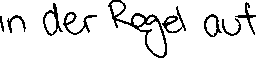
in der Regel auf
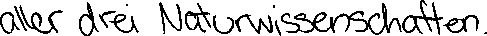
aller drei Naturwissenschaften.
